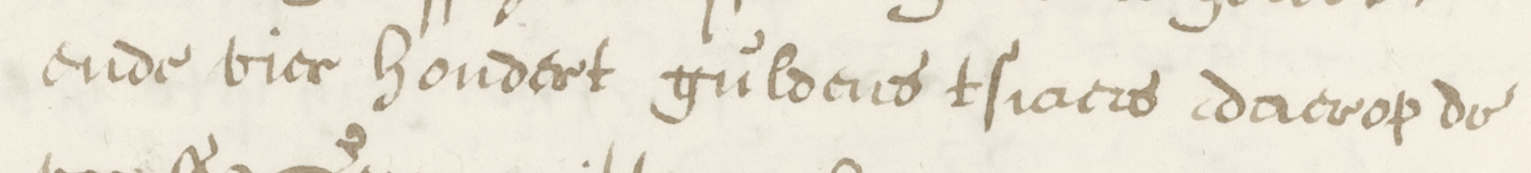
ende vier hondert guldens tsiaers, daerop de
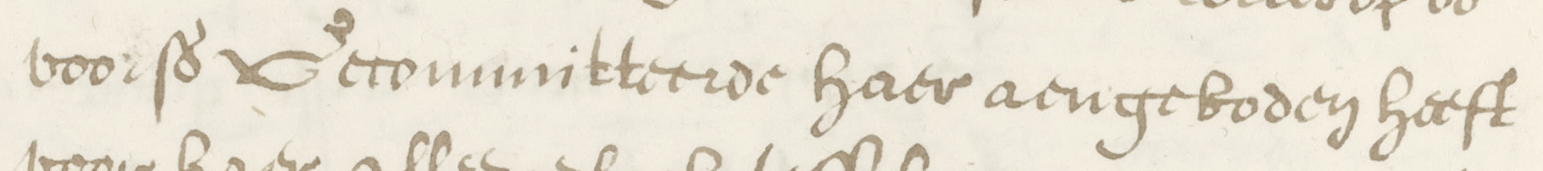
voors Gecommitteerde haer aengeboden heeft
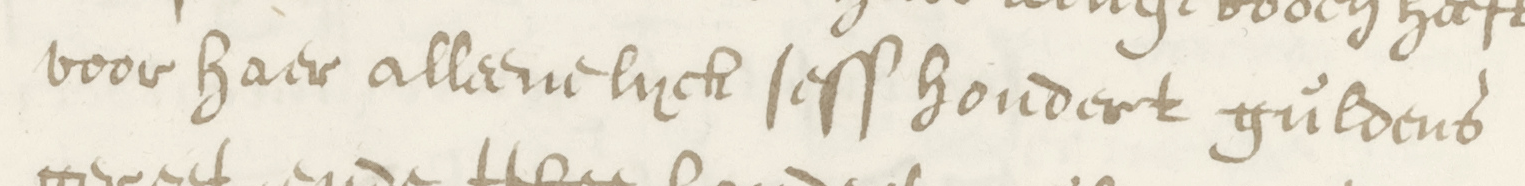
voor haer alleenelyck sess hondert guldens
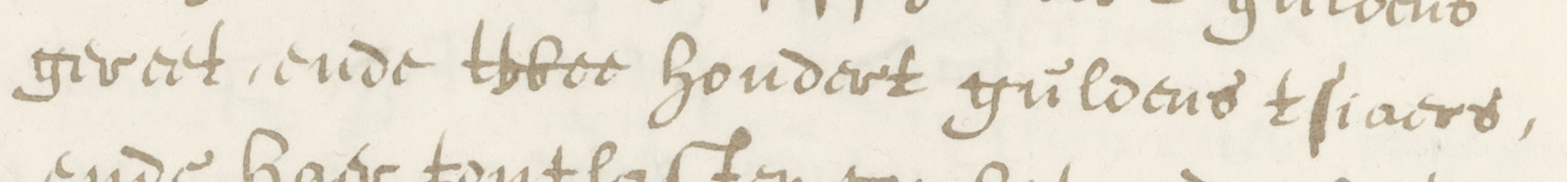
gereet, ende twee hondert guldens tsiaers,
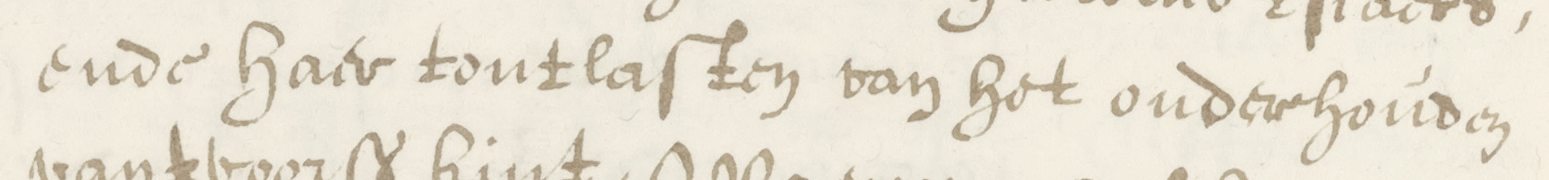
ende haer tontlasten van het onderhouden
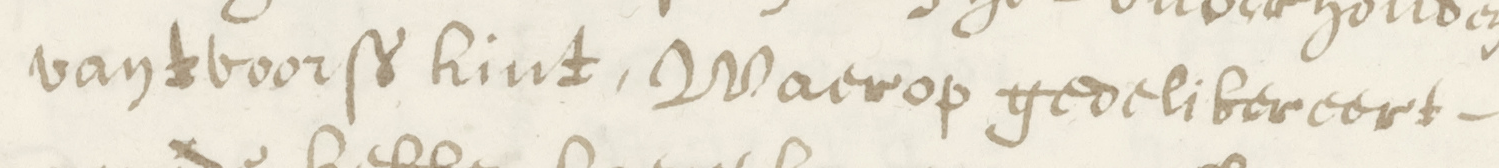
van tvoors kint. Waerop gedelibereert
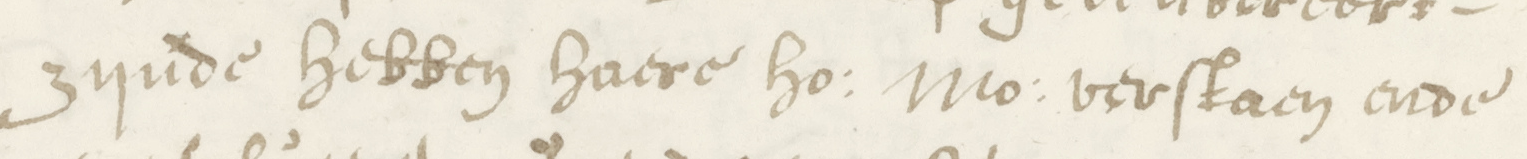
zynde hebben haere ho:Mo: verstaen ende
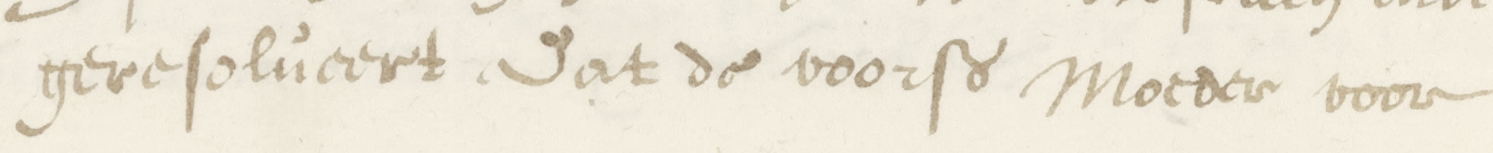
geresolueert, dat de voors Moeder voor
